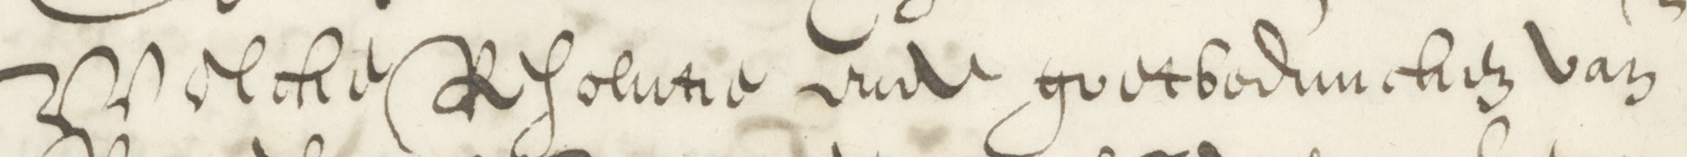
Welcke Resolutie ende goetbeduncken van
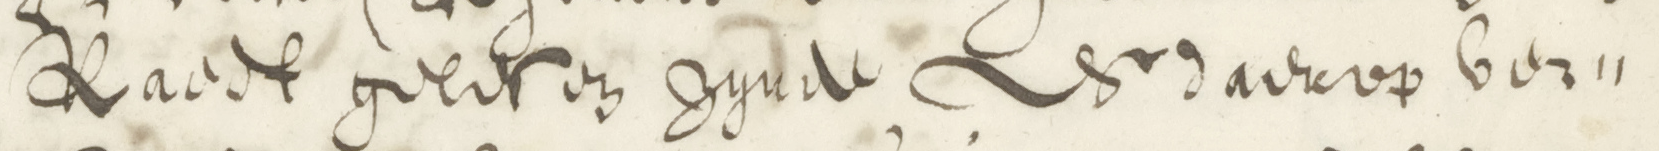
Raedt gelesen zynde. Es daerop ver„
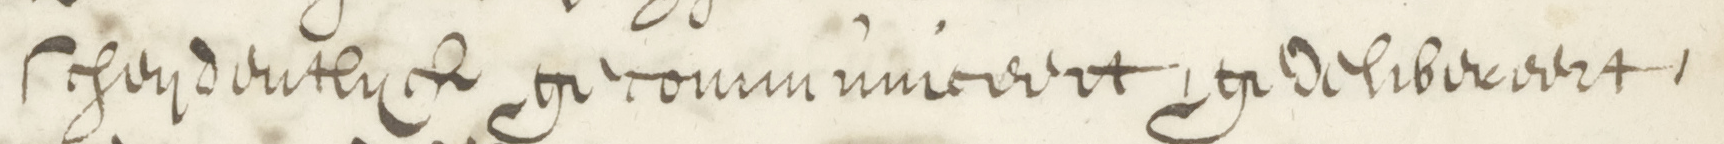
scheydentlyck gecommuniceert, gedelibereert,
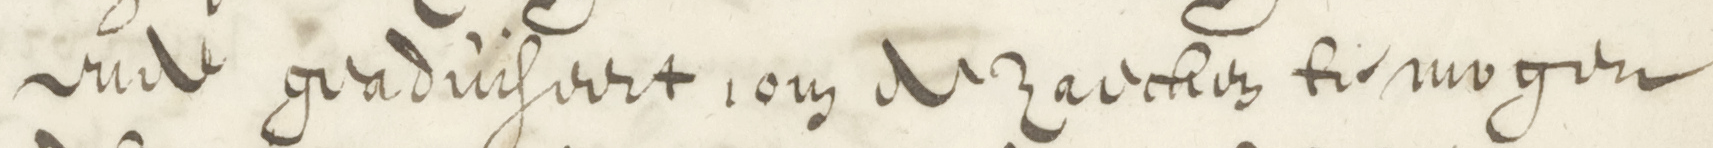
ende geaduiseert, om de zaecken te mogen
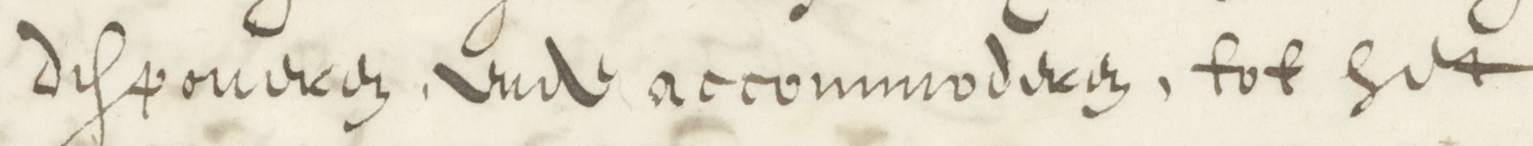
disponeren, ende accommoderen, tot het
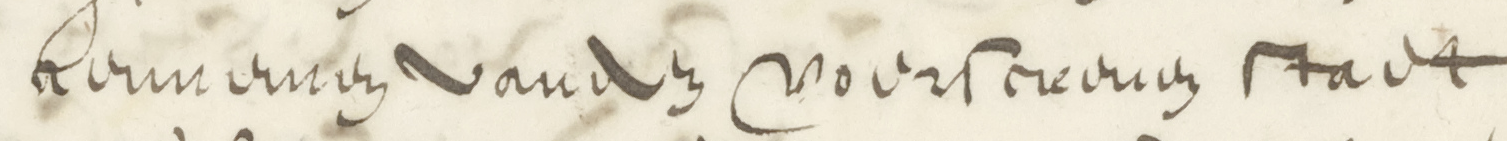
aennemen vanden voerscreuen staet
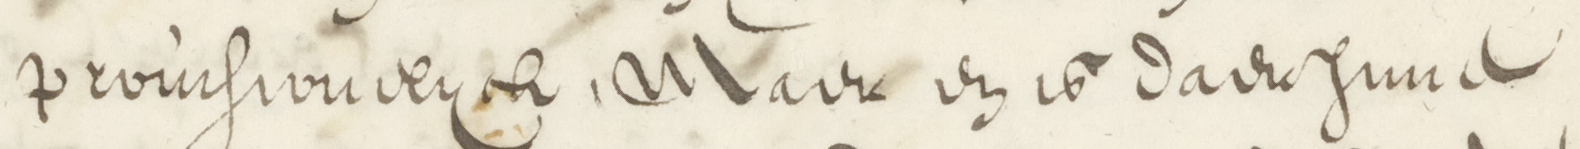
prouisionelyck. Maer en is daerinne
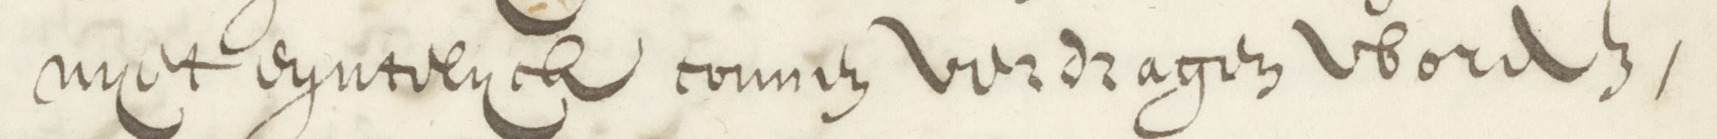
nyet eyntelyck connen verdragen worden.
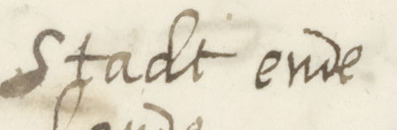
Stadt ende
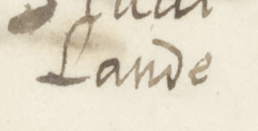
Lande
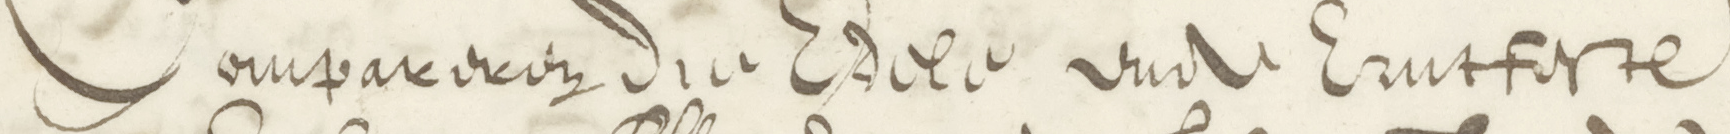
Compareren die Edele ende Erntfeste
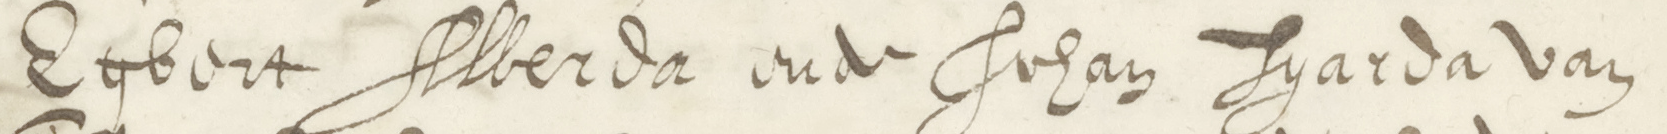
Egbert Alberda ende Johan Tyarda van
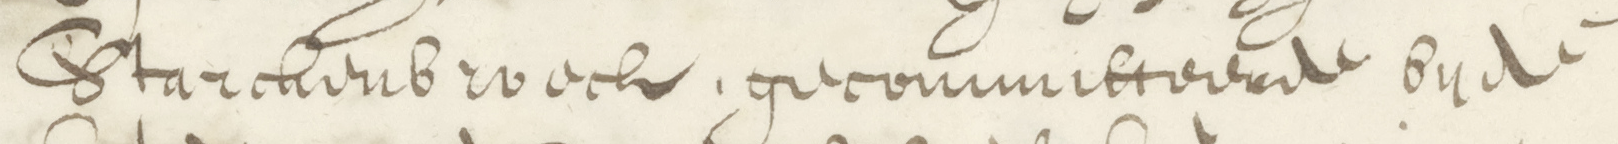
Starckenbroeck, gecommitteerde byde
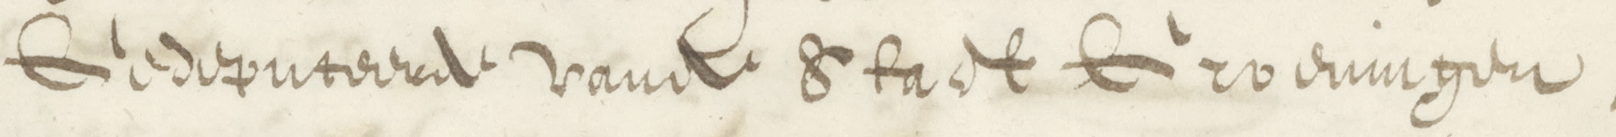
Gedeputeerde vande Stadt Groeningen,
